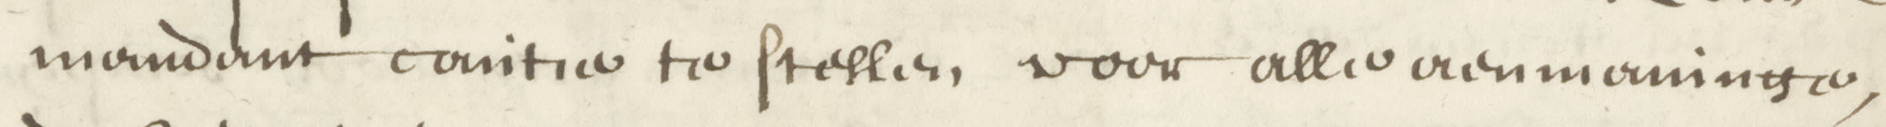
mandant cautie te stellen voor alle aenmaninge
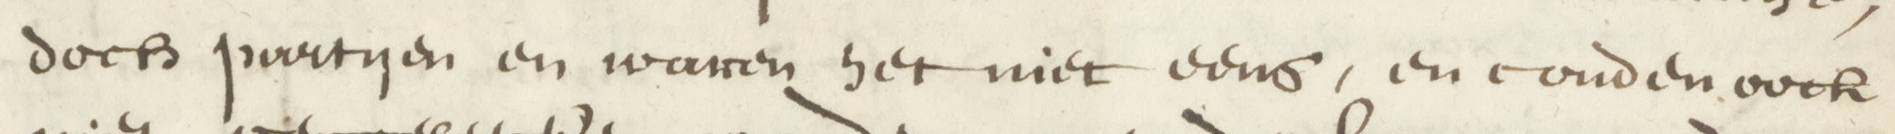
doch partyen en waren het niet eens, en conden oock
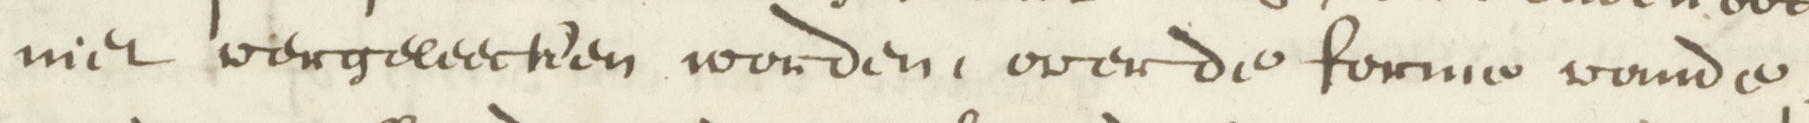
niet vergeleecken worden, over de forme vande
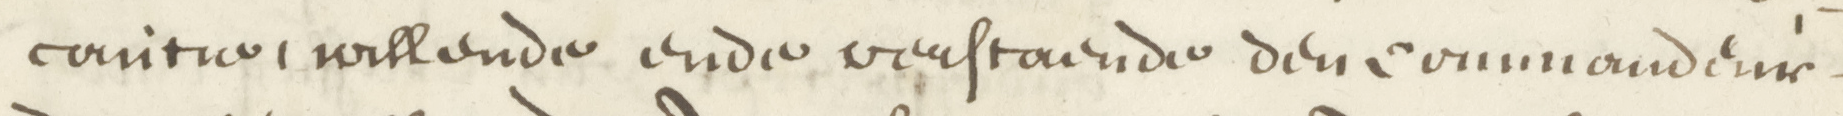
cautie, willende ende verstaende den commandeur
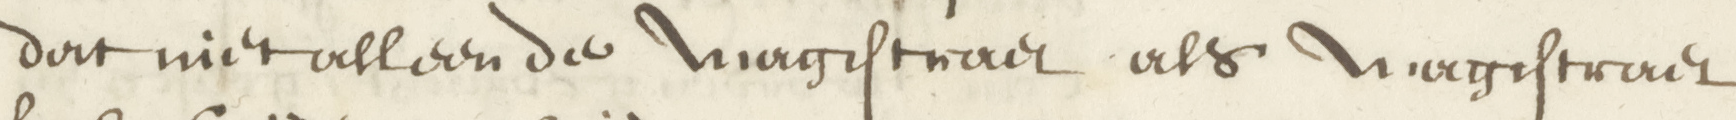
dat niet alleen de Magistraet als Magistraet
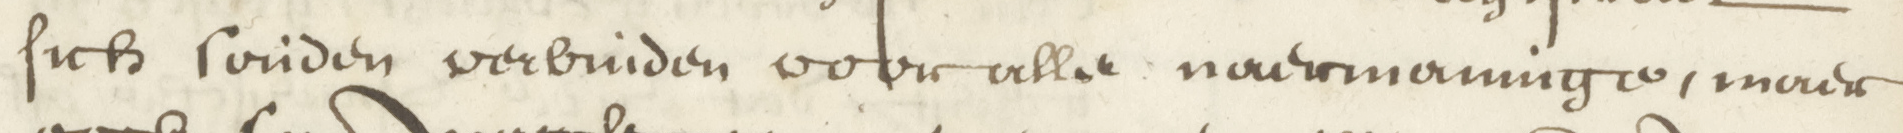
sich souden verbinden voor alle naermanninge, maer
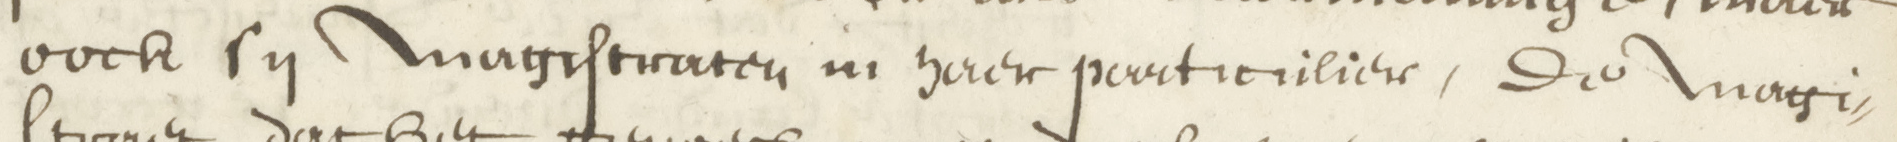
oock sy Magistraten in haer particulier. De Magi„,
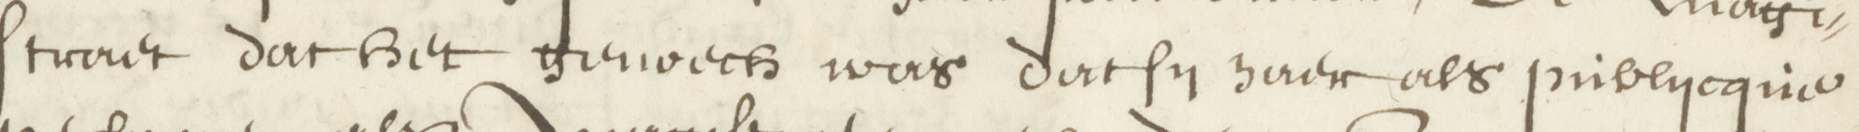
straet dat het genoech was dat sy haer als publycque
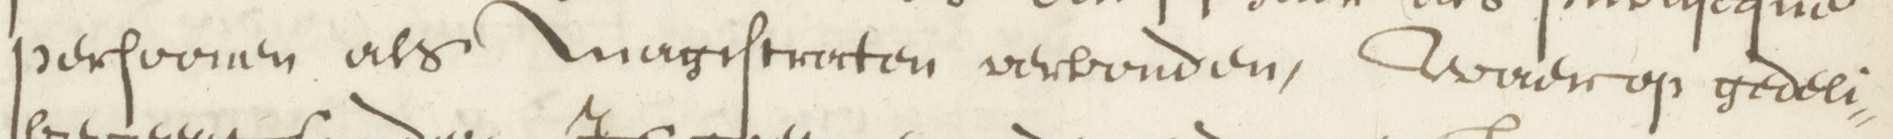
persoonen als magistraten verbonden. Waerop gedeli„
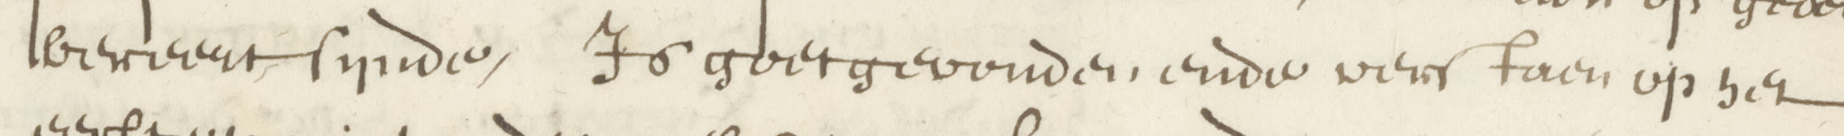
bereert synde, Is goetgevonden ende verstaen op het
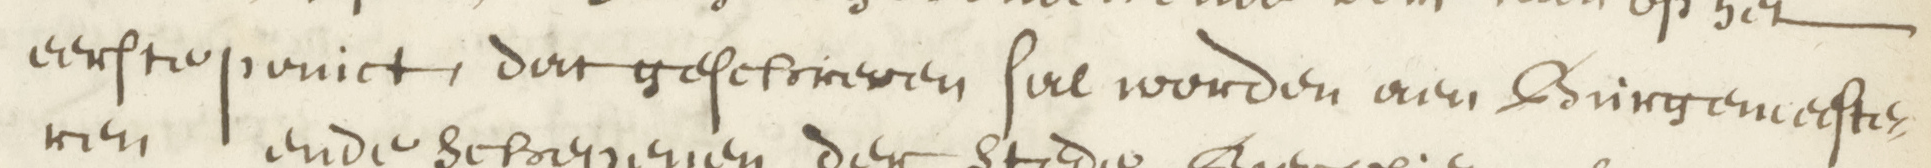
eerste poinct, dat geschreven sal werden aen Burgemeeste,
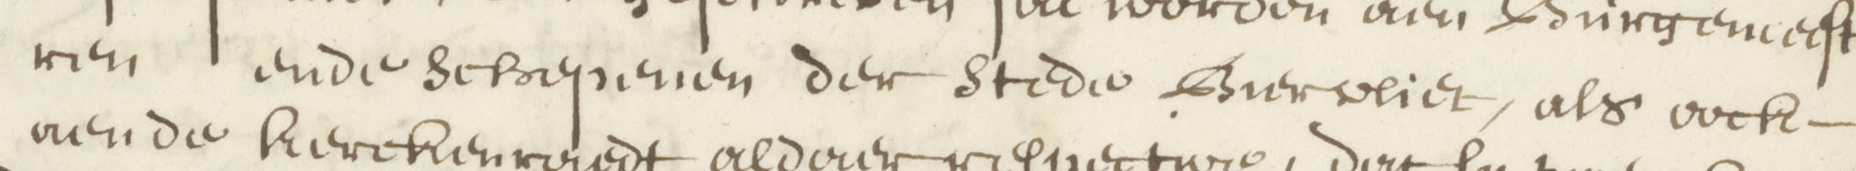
ren ende schepenen der stede Biervliet, als oock
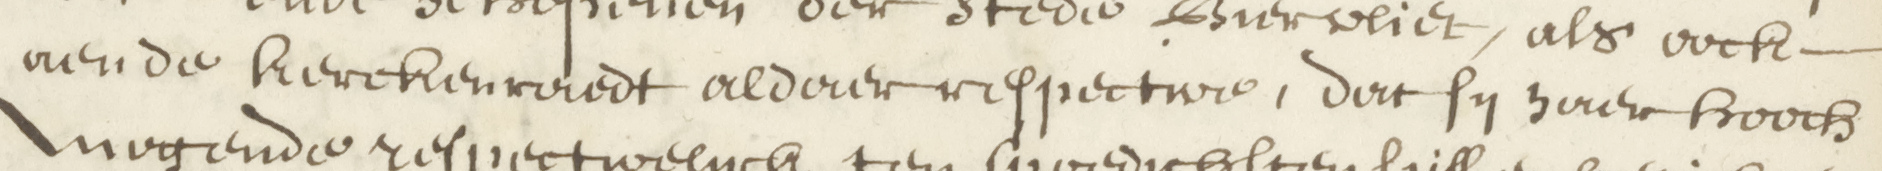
aen de kerckenraedt aldaer respective, dat sy haer hooch
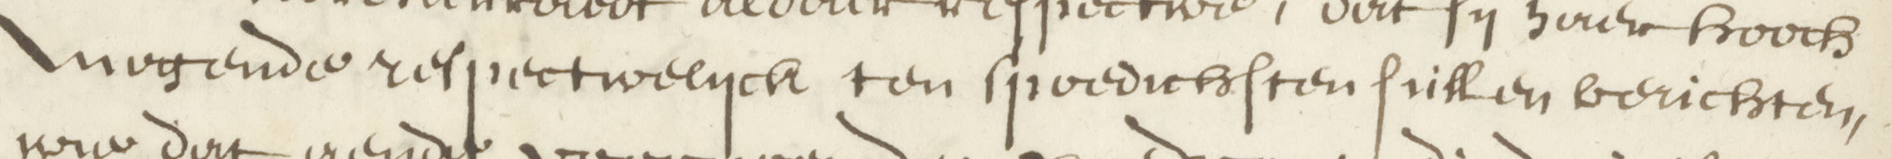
mogende respectivelyck ten spoedichsten sullen berichten,
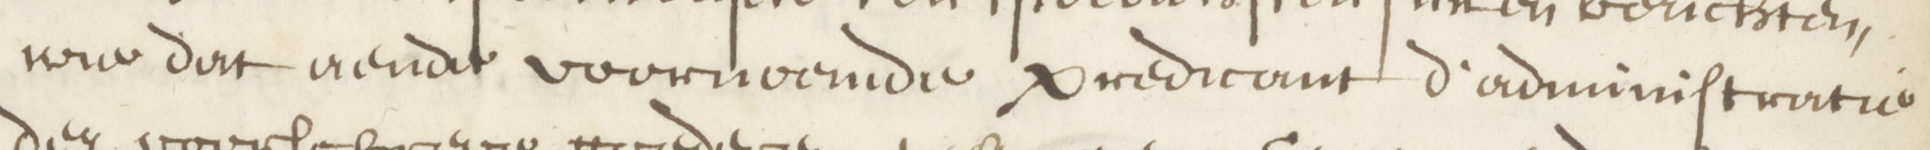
wie dat aende voornoemde predicant d'administratie
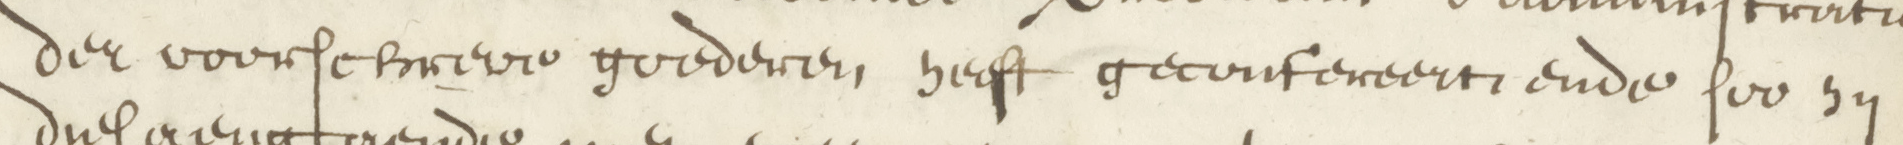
der voorschreve goederen heeft geconfereert ende soo sy
